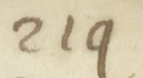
214
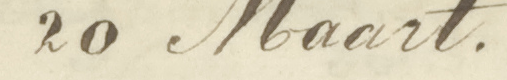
20 Maart.
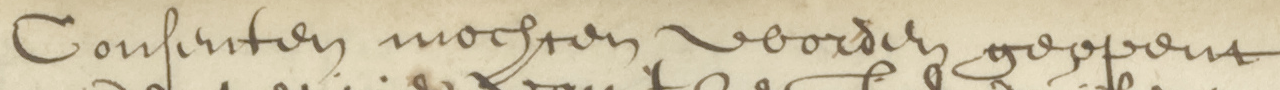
Consenten mochten worden geopent
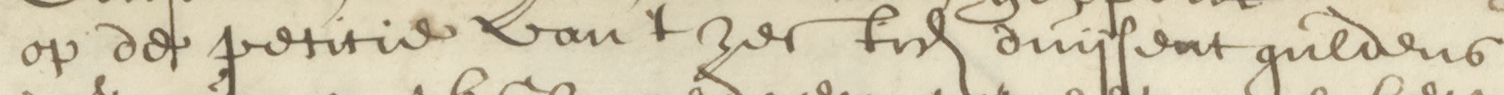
op de petitie van 't zestich duijsent guldens
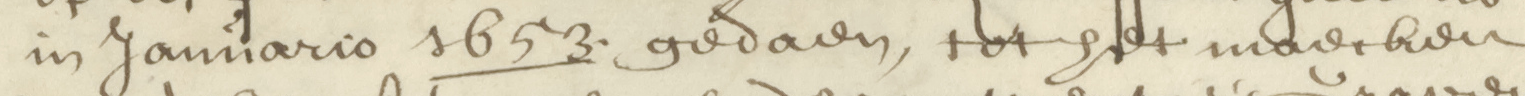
in Januario 1653 gedaen, tot het maecken
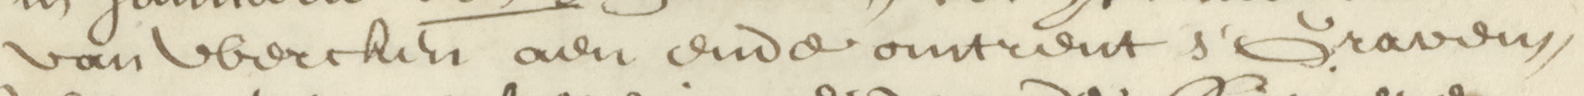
van wercken aen ende omtrent s' Graven„
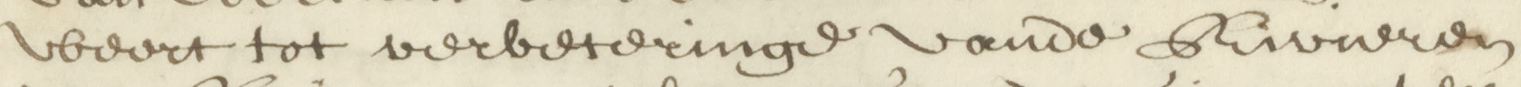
weert tot verbeteringe vande Rivieren
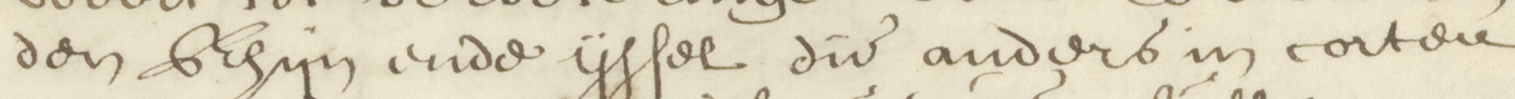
den Rhijn ende IJssel die anders in corten
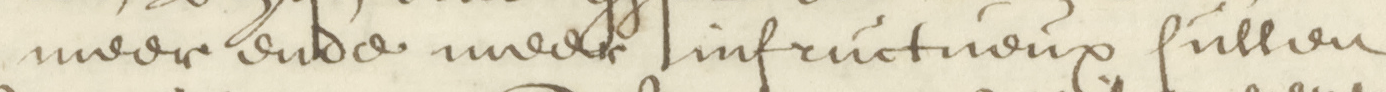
meer ende meer infructueux sullen
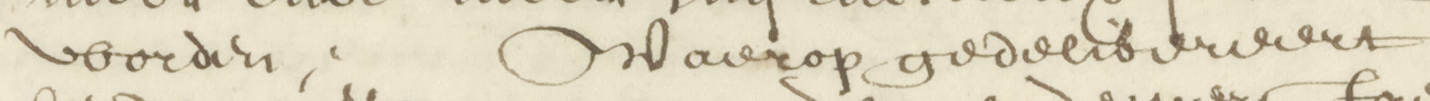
worden; Waerop gedelibereert
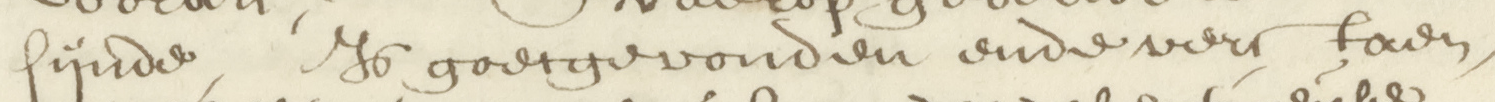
sijnde, Is goetgevonden ende verstaen,
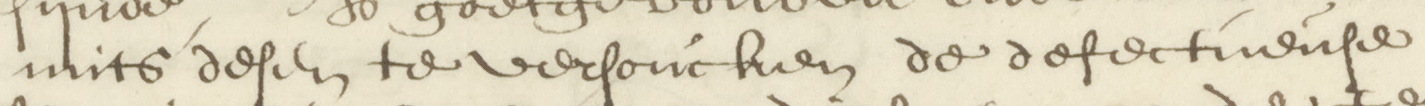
mits desen te versoucken de defectueuse
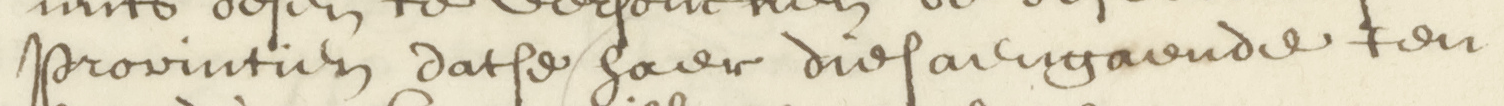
Provintien datse haer diesaengaende ten
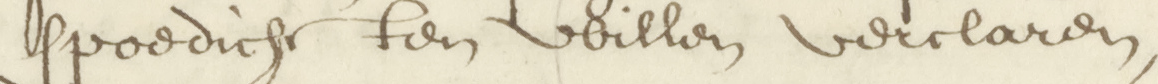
spoedichsten willen verclaren.
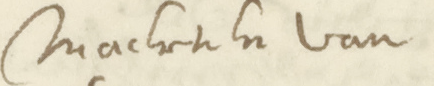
maerten van
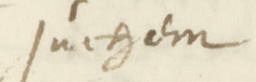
juchem
